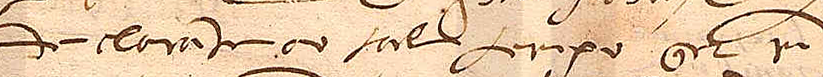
declarāte ao tal tempo ser mto
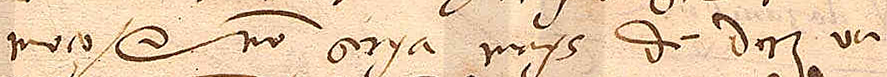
moço / e nō serya mays de dez ou
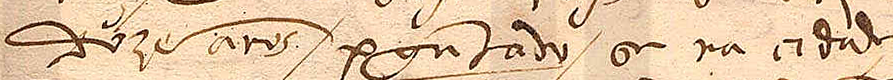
doze ānos / ꝑgūtado / se na cidade
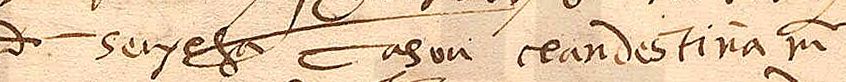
de seuylha casou clandestinamte
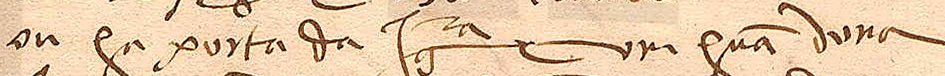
ou ha porta da Jgra Com hūa dona
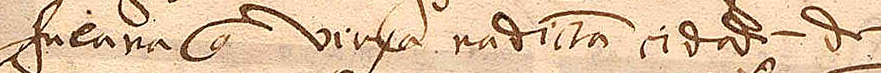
fulana q̄ viuya na dīcta cidade de
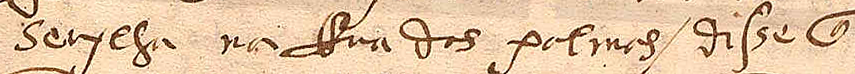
seuylha na Rua das palmas / disse q̄
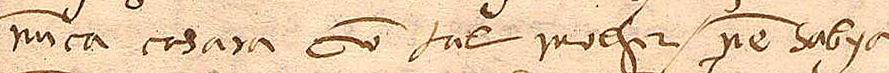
nūca casara cō tal molher / nē sabya
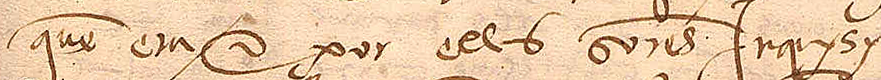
quē era / e por elles s̄ores Jnquysy
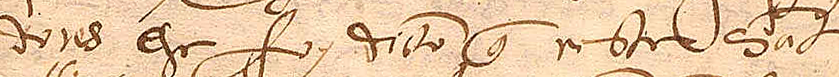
dores lhe foy dīcto q̄ neste Sāto
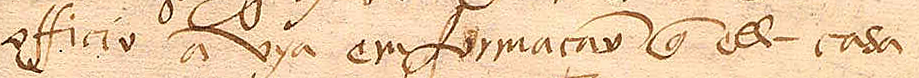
officio avya emformação q̄ elle casa
